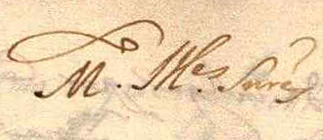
M.to Ill.es Snrēs.
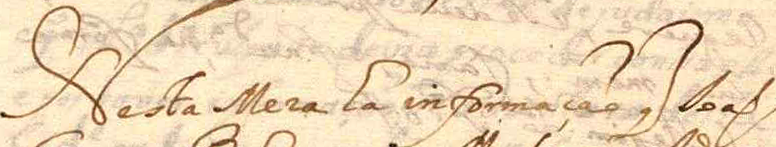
Nesta Meza ha informaçaõ q̄ Ioaõ
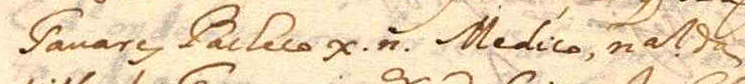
Tauares Pacheco x. n. Medico, nal da
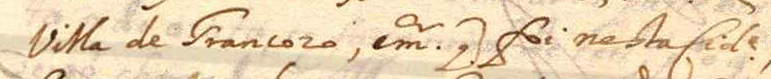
Villa de Trancozo, e m.or q̄ foi nesta Cid.e,
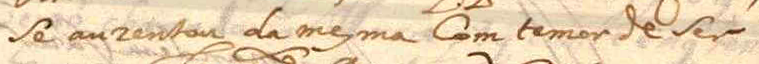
se auzentou da mesma Com temor de ser
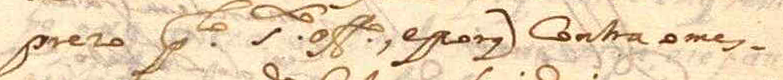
prezo p.lo s.to off.o, e porq̄ Contra o mes
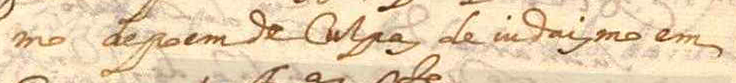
mo depoem de Culpas de iudaismo em
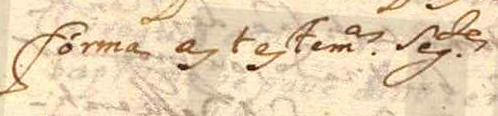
forma as testem.as seg.tes
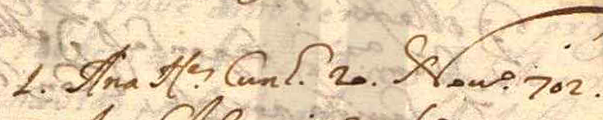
1. Ana H.es Cunh. 20. Nou.o 702.
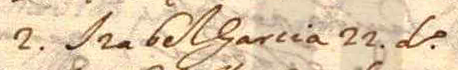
2. Izabel Garcia 22. d.o
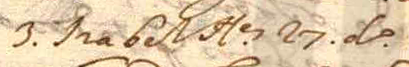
3. Izabel H.es 27. d.o
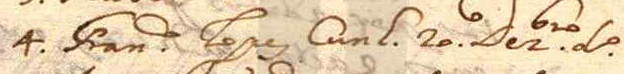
4. Fran.co Lopes Cunh. 20. Dez.bro d.o
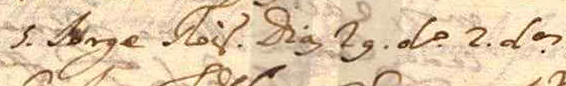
5. Iorge Rois̄. Dias 29. do 2. d.o
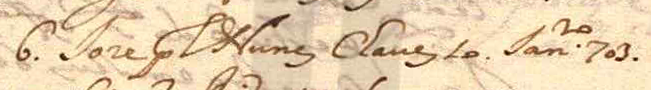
6. Iozeph Nunes Chaues 10. Ian.ro 703.
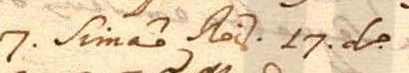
7. Simaõ Rois̄. 17. d.o
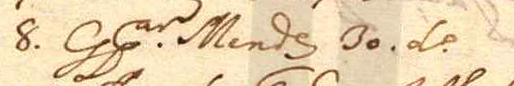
8. Gp.ar Mendes 30. d.o
